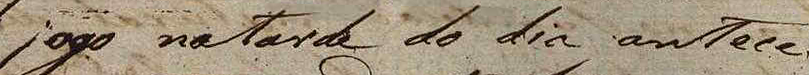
jogo na tarde do dia antece
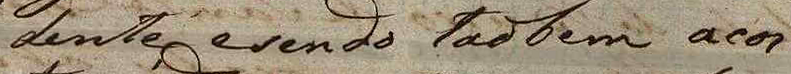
dente, e sendo taõbem acos
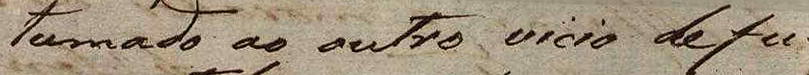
tumado ao outro vicio de fu
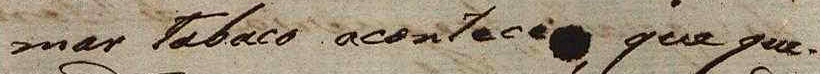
mar tabaco acontece_, que que
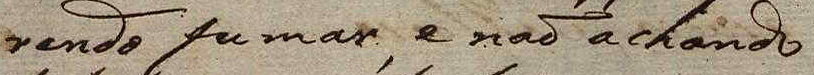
rendo fumar, e naõ achando
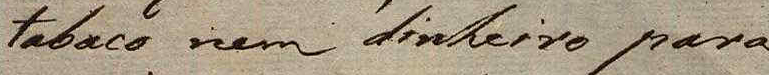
tabaco, nem dinheiro para
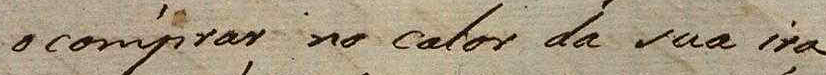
o comprar, no calor da sua ira,
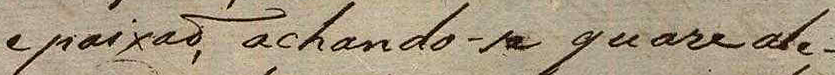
e paixaõ, achando-se quaze ale
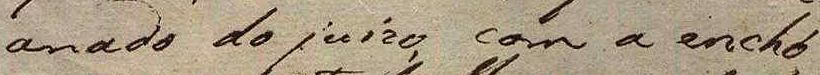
anado do juízo, com a enchó,
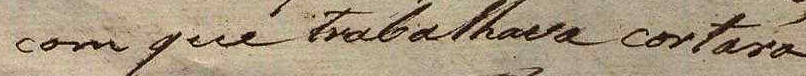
com que trabalhava cortara
